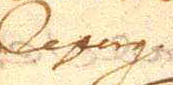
Reperg.
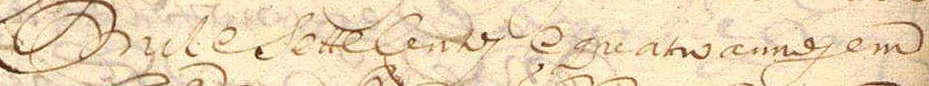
mil e setteCentos e quatro annos em
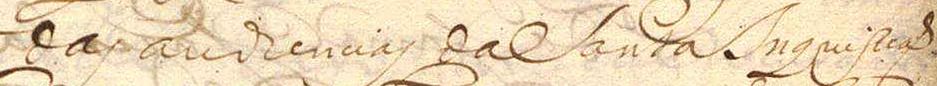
das audiencias da Santa Inquisicaõ
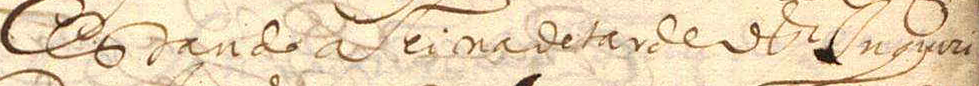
E estando ahi na de tarde o sor Inquizi
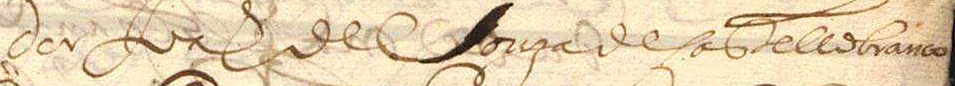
dor Joaõ de Souza de Castello branco
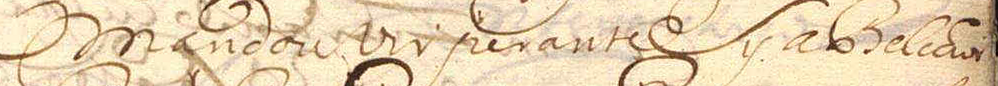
mandou vir perante Sy a Belchior
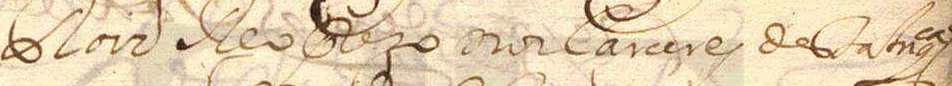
Roiz̄ Reo prezo nos Carceres desta Inqca_
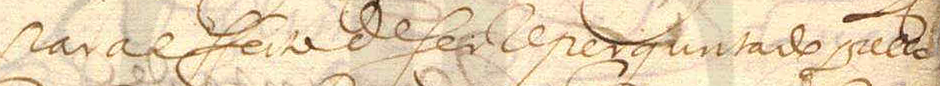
para effeito de ser Reperguntado pello
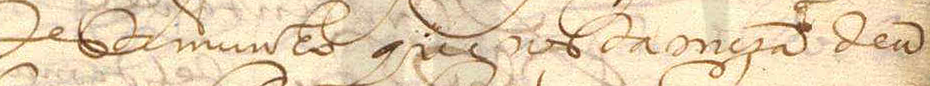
testemunho que nesta meza deu
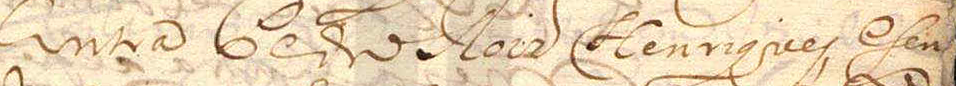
Contra Pedro Roiz̄ Henriques, e sen
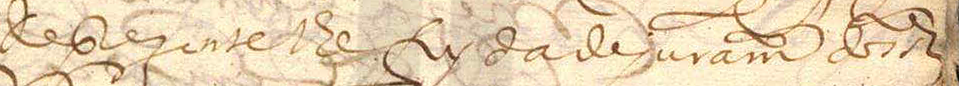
do prezente lhe foy dado juramento dos stos
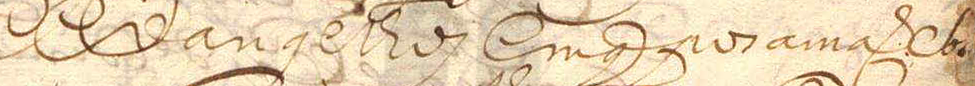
evangelhos em q̄ pos a maõ so
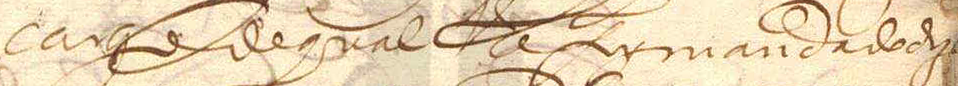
cargo do qual lhe foy mandado diz
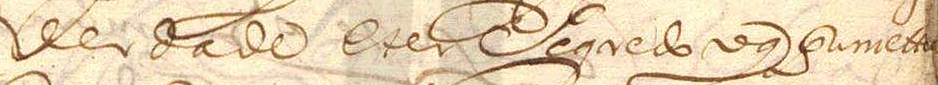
verdade e ter Segredo o q̄ promett
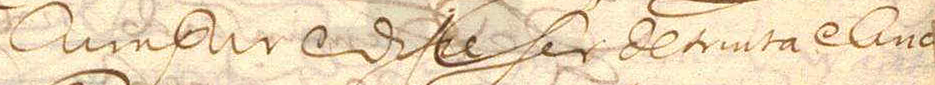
Cumprir e disse ser de trinta e Cinc
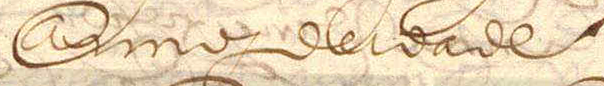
annos de idade
